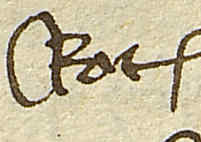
Rot*
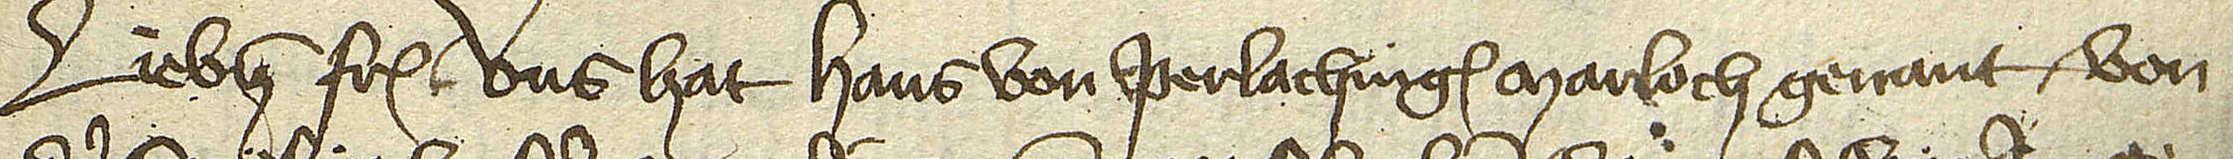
Liebn* fr* / Vns hat hans von Perlaching* Marloch genant / von
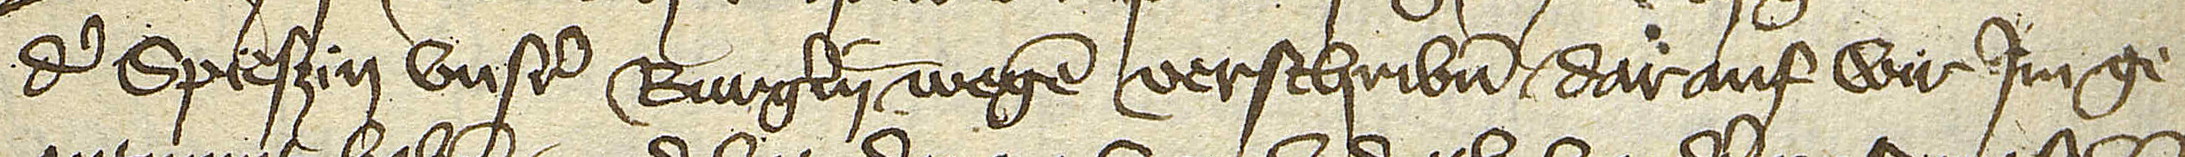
d* Spieſʒin vnſr* Burg*in wege* verſchribn* / darauf wir Im ge
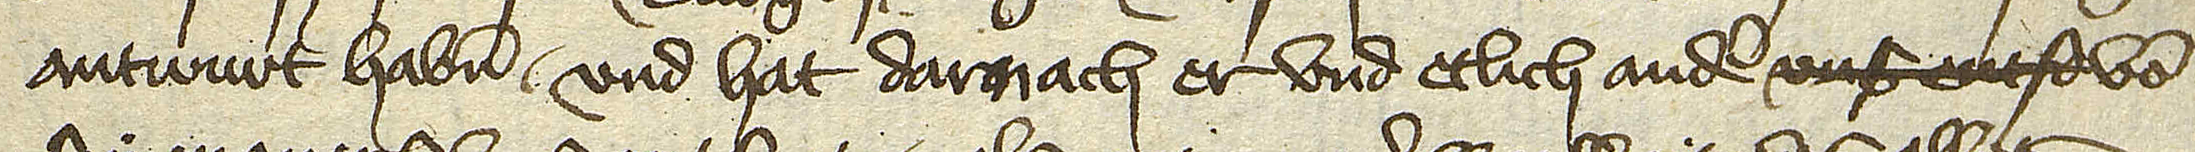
antwurt habn* / vnd hat darnach er vnd etlich ande* vnſ* entſo vo*
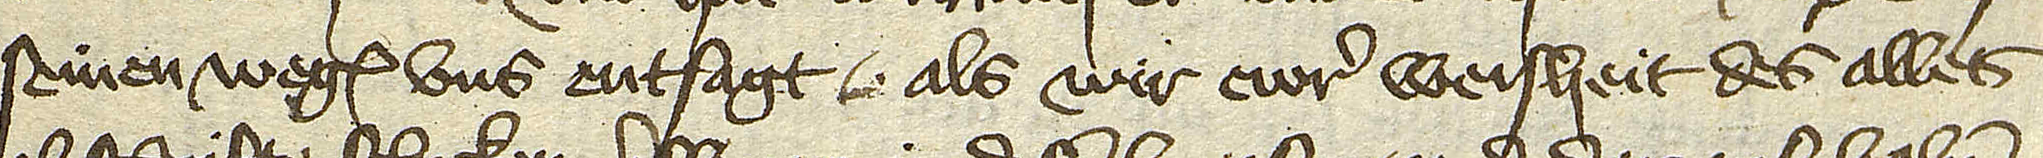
ſeinen weg* vns entſagt / . als wir ewr* weiſheit des alles
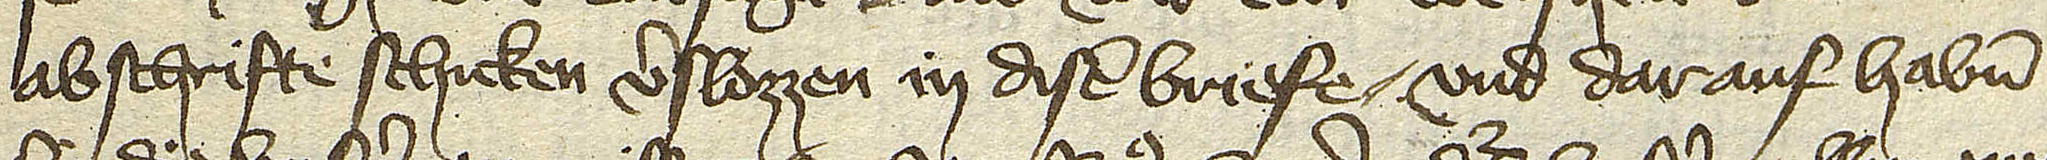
abſchrifte ſchicken v*ſloʒʒen in diſe* briefe / vnd darauf habn*
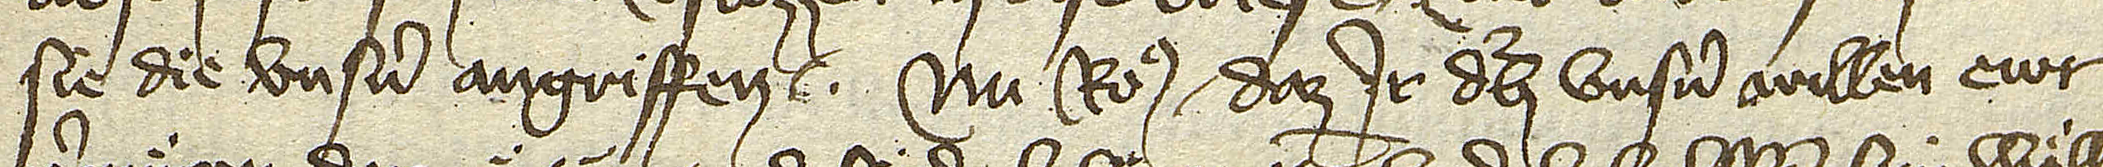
ſie die vnſn* angriffen / . Nu Ro* / daʒ Ir d*h vnſn* willen ewr
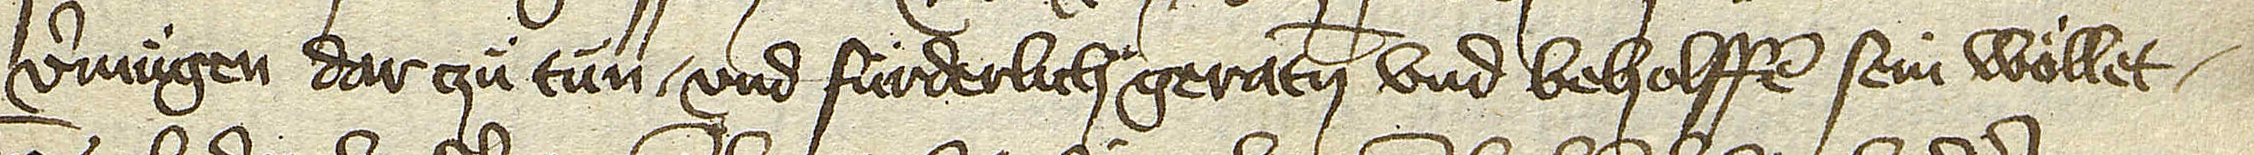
v*mügen darcʒü tün / vnd fürderlich geratn* vnd beholffe* ſein wöllet /
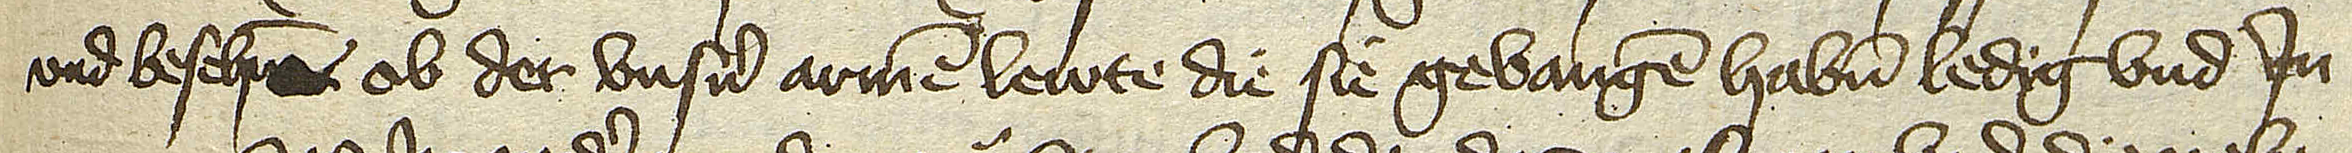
vnd beſchr*%% ob der vnſn* arme* lewte die ſie gevange* habn* ledig vnd In
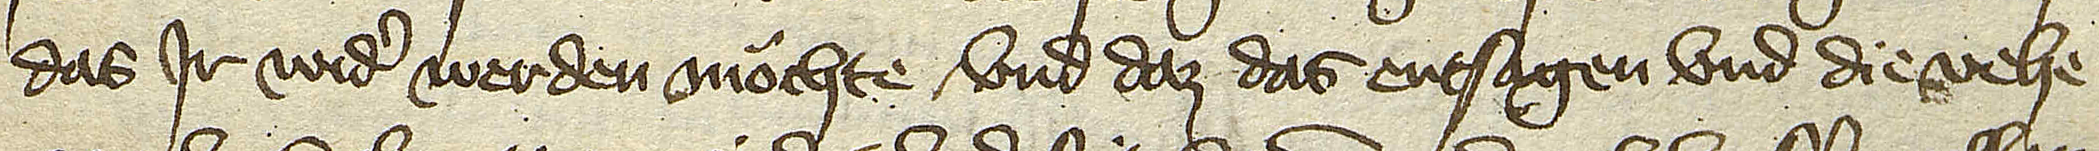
das Ir wid* werden möchte / vnd daʒ das entſagen vnd die vehe
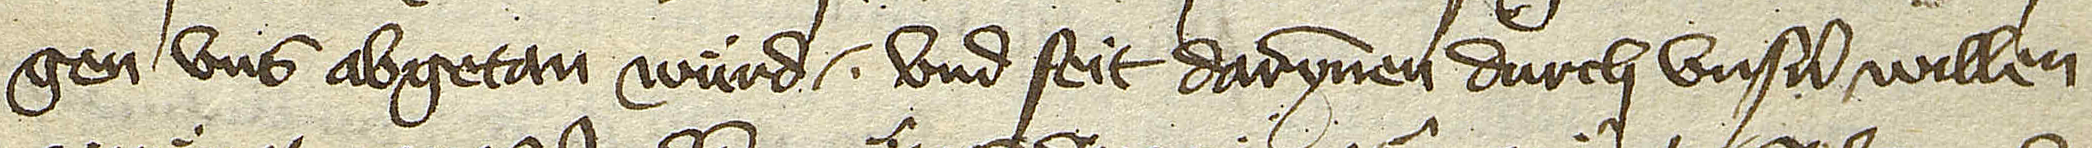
gen vns abgetan würd / . vnd ſeit darynen* durch vnſn* willen
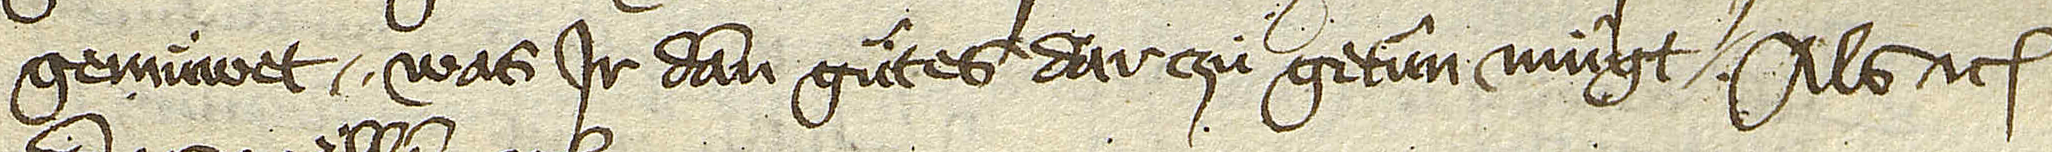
gemüwet / was Ir dan* gütes darcʒu getün mügt / . Als ec*
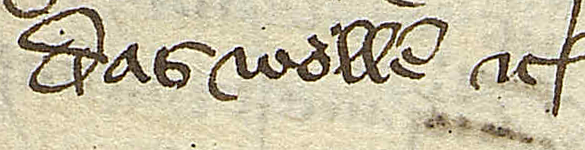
Das wölle* ec*
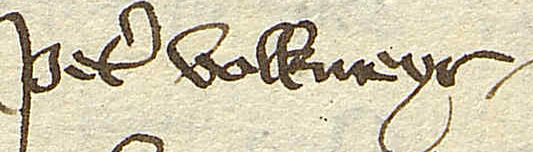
Pet* volkmeyr /
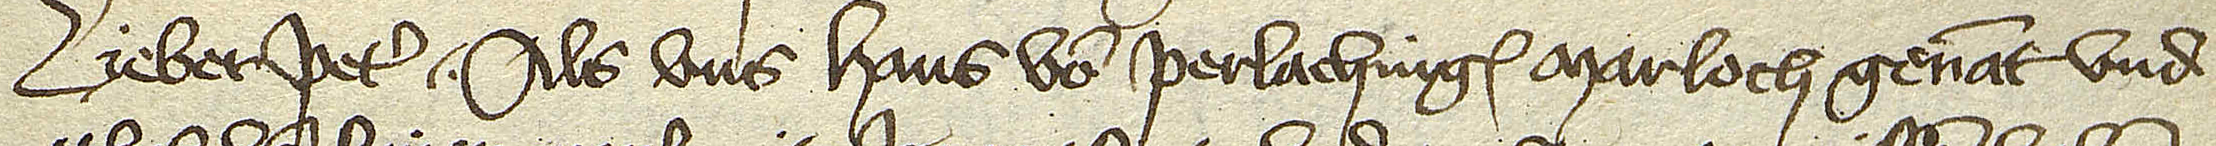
Lieber Pet* / . Als vns hans v* Perlaching* Marloch genat* vnd
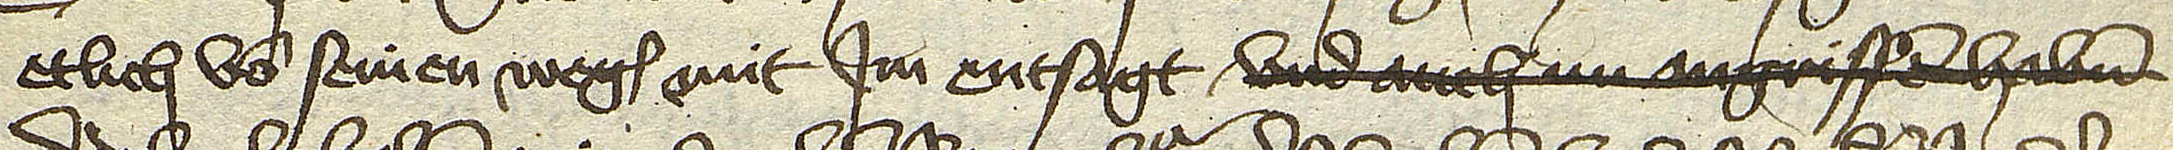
etlich vo* ſeinen weg* mit Im entſagt / vnd auch nu angriffe* habn*
